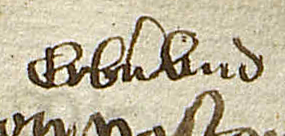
Erb*n Vnd
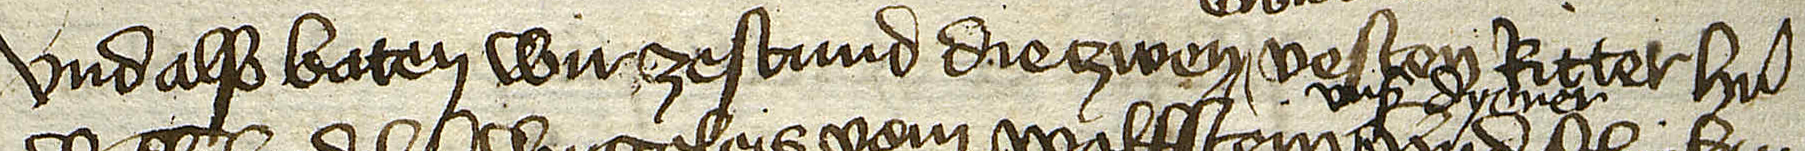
Vnd alſo baten wir cʒeſtund die cʒwen veſten Ritter hn*
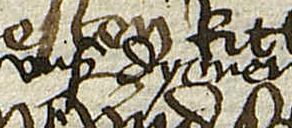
vnſ* dyener
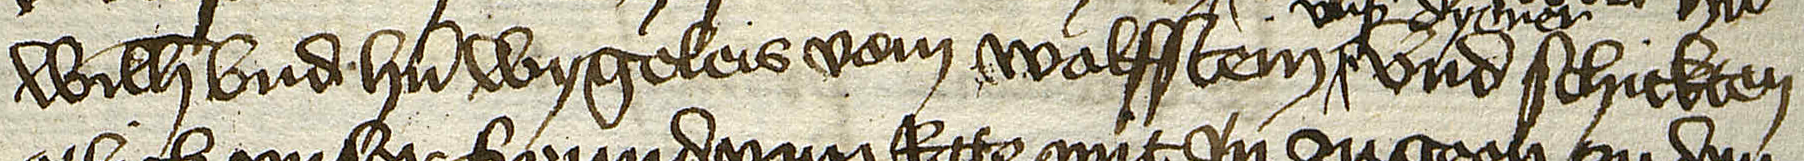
Wilh* Vnd h*n Wygeleis vom wolfſtein vnd ſchickten
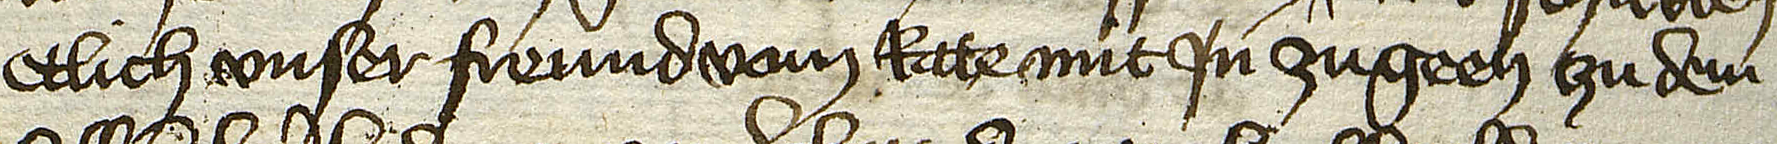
etlich vnſer freund vom Rate mit In cʒugeen cʒu dem
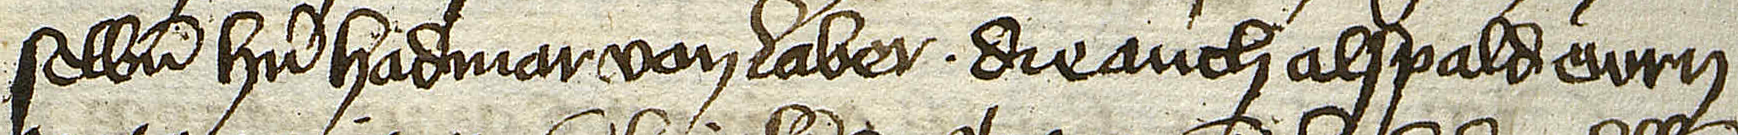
ſelb*n h*n hadmar von Laber . die auch alſpald ewrn
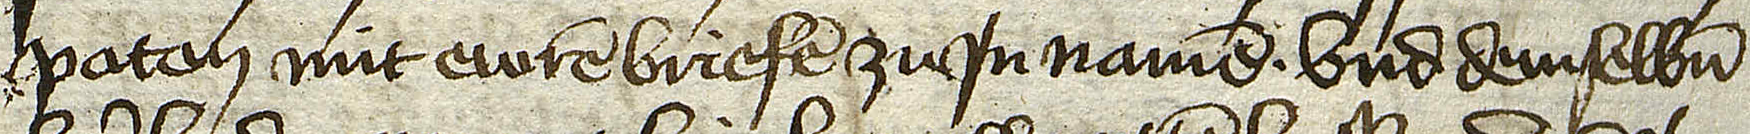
poten mit ewre* briefe* ʒu In name* . Vnd demſelb*n
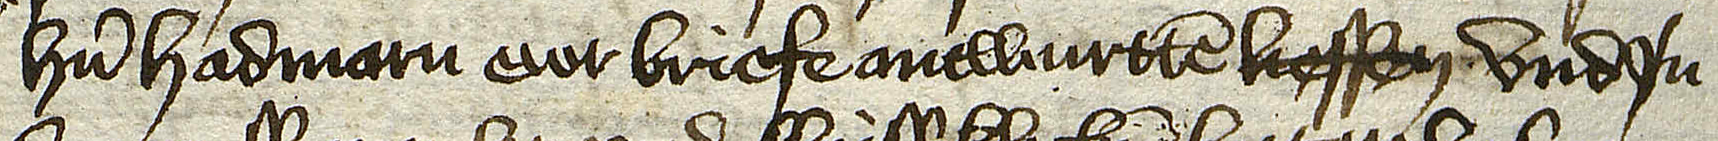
h*n hadmarn ewr briefe antwurtte* lieſſen . Vnd In
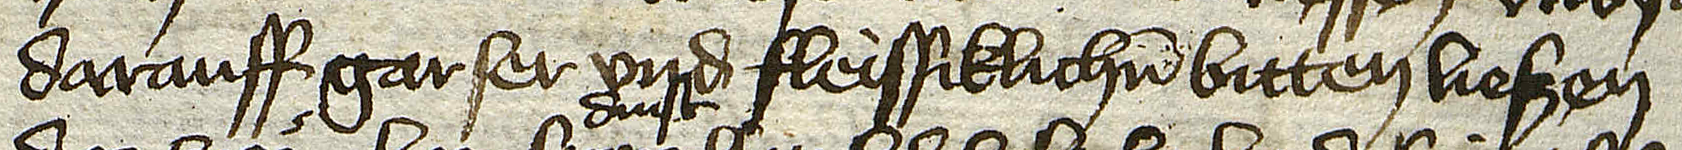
darauff gar ſer vnd fleiſſiklich*n bitten lieſʒen
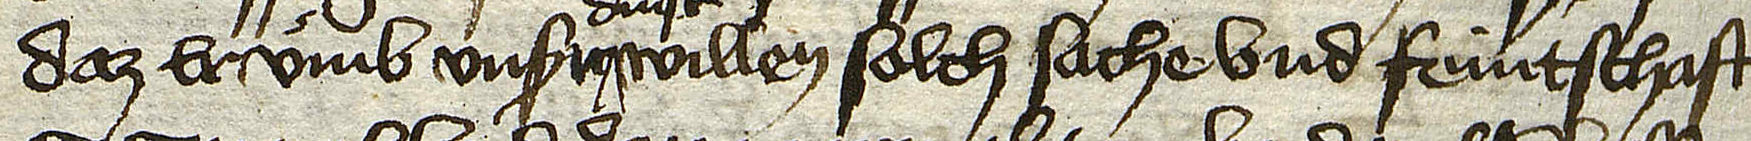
daʒ Er v̈mb vnſ* willen ſolch ſache vnd feintſchaft
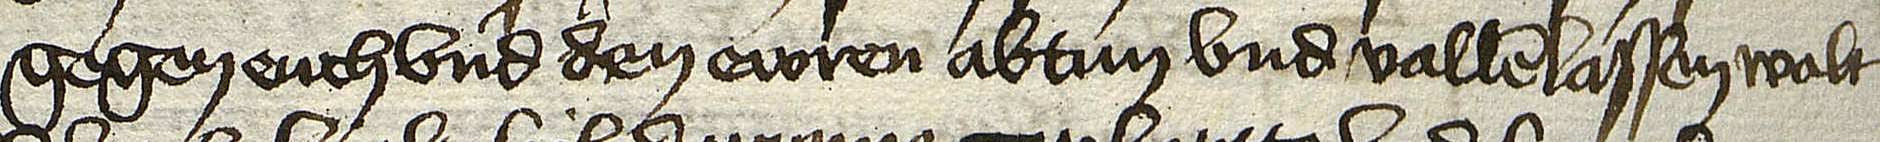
gegen euch vnd den ewren abtun vnd valle* laſſen wolt
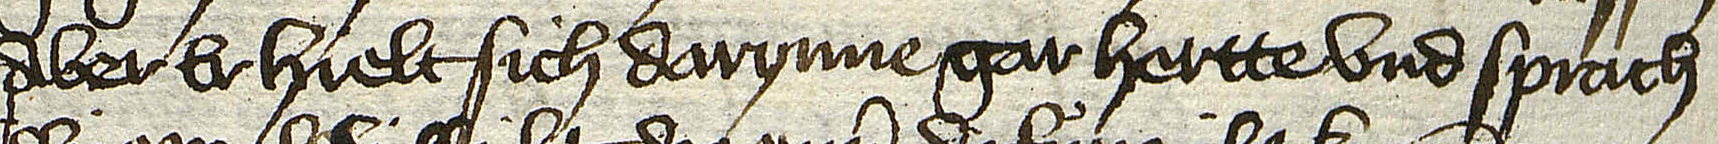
Aber Er hielt ſich darynne gar hertte vnd ſprach
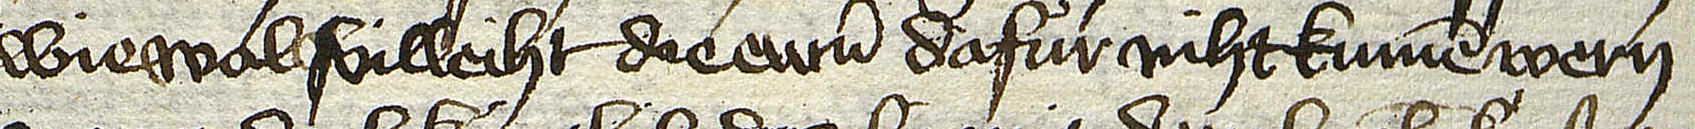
wie wol ſvilleiht die ew*n dafür niht kume* wern
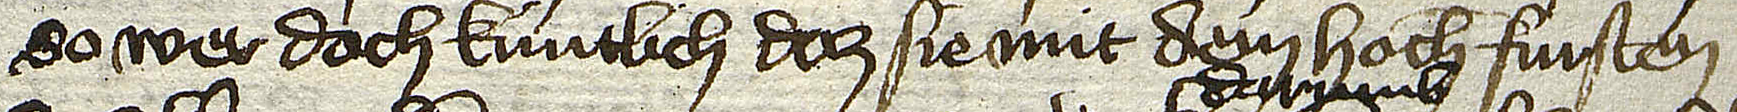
So wer doch küntlich daʒ ſie mit dem hoch* fürſten
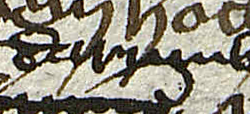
darumb
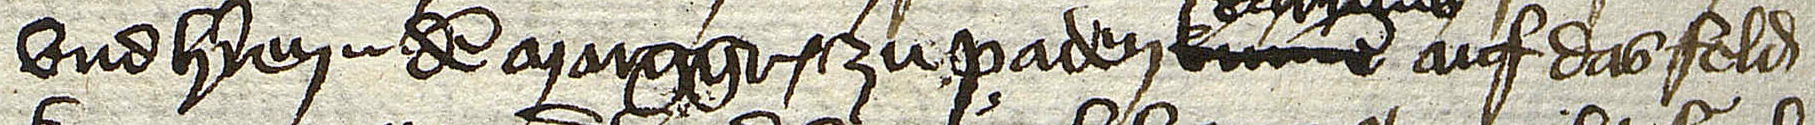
vnd h*ren . de* Marggr* ʒu paden kume* auf das feld
